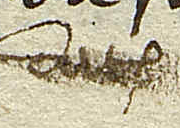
dat*
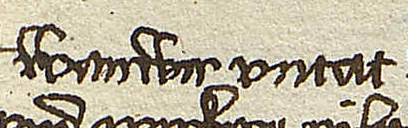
Wan wir vntat
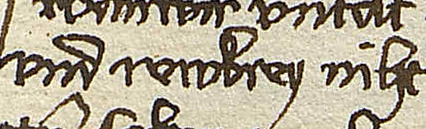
vnd rewbrey niht
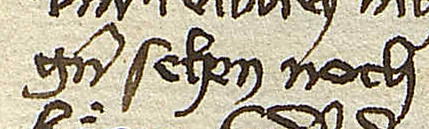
gn* ſehen noch
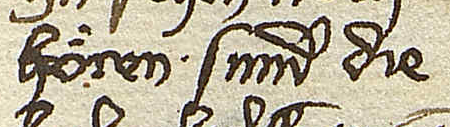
hören . ſund* die
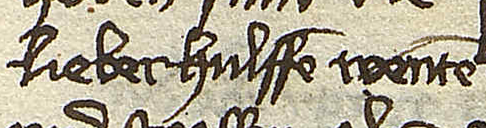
lieber hulffe* wente*
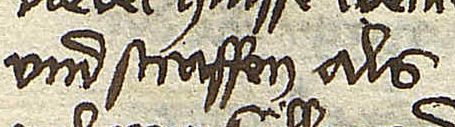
vnd ſtraffen als
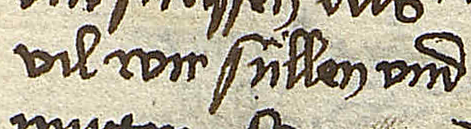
vil wir ſüllen vnd
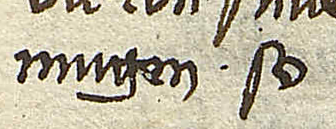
mugen . ſo
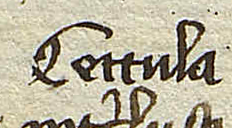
Cettula
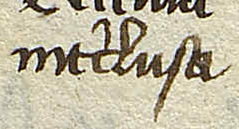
int*cluſa
